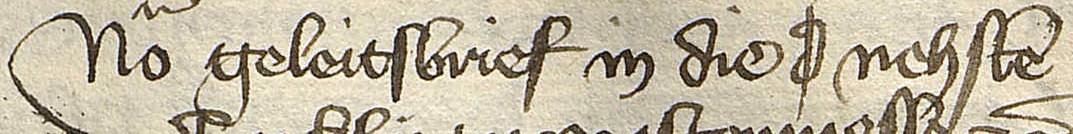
No* geleitſbrief in die d nehſte*
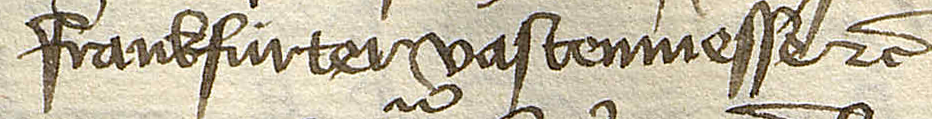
Frankfürter vaſtenmeſſe ec*
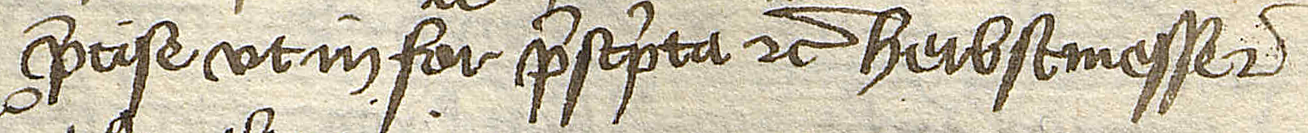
p*ciſe vt in for* p*ſcp*ta ec* herbſtmeſſe ec*
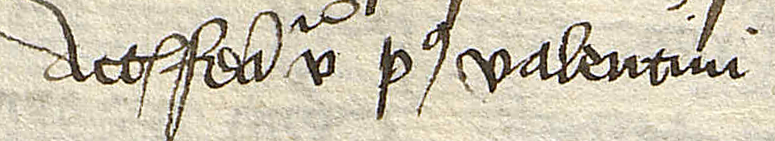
Act* fea* v* p* valentini
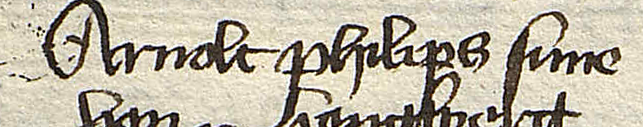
Arnolt philips ſune
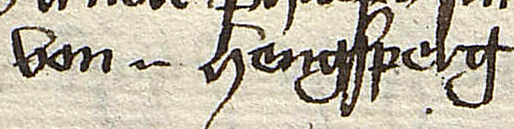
von ~ Hengſperg
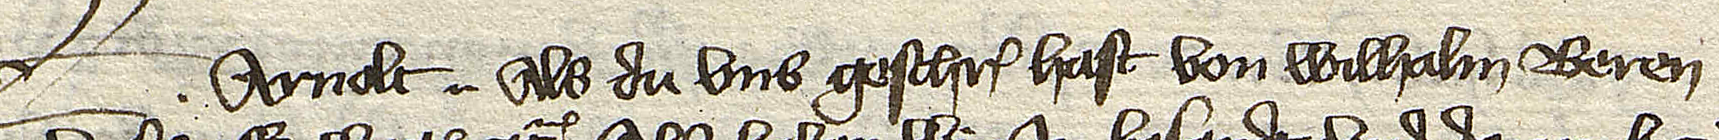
L* Arnolt ~ Als du vns geſchr* haſt von wilhalm Beren
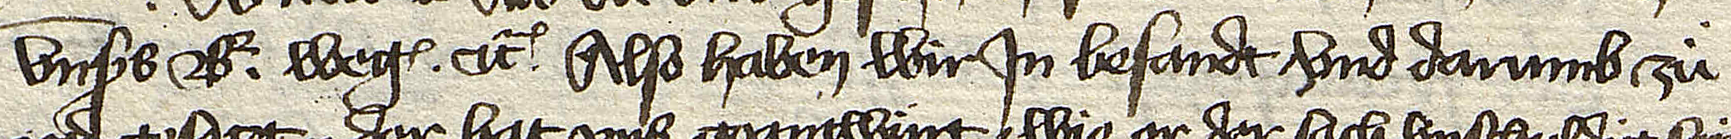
vnſ*s B* weg* ec* Alſo haben wir In beſandt / Vnd darumb cʒü
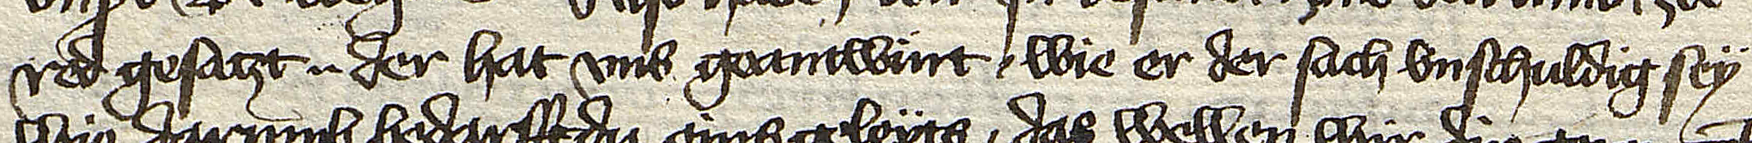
red geſacʒt ~ der hat vns geantwürt / wie er der ſach vnſchuldig ſey
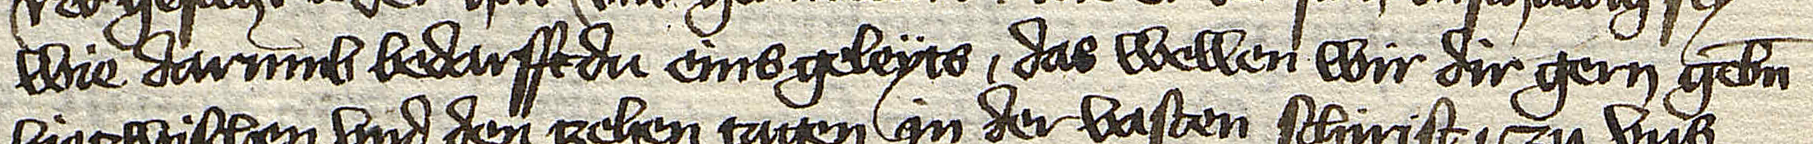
wie darumb bedarfft du eins geleyts / das wellen wir dir gern gebn*
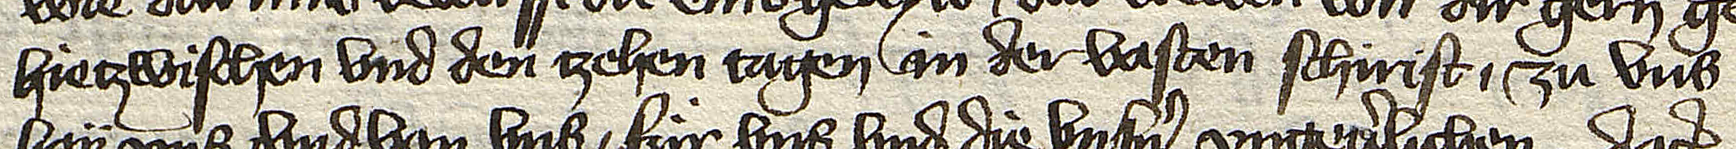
hiecʒwiſchen vnd den cʒehen tagen in der vaſten ſchiriſt / cʒu vns
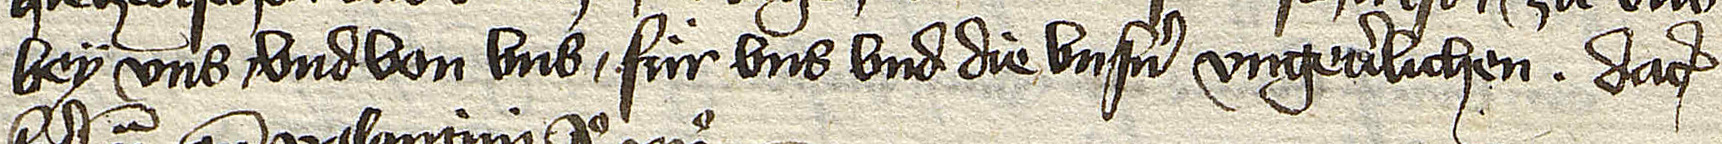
bey vns / vnd von vns / für vns vnd die vnſn* vngeu*lichen . dat*
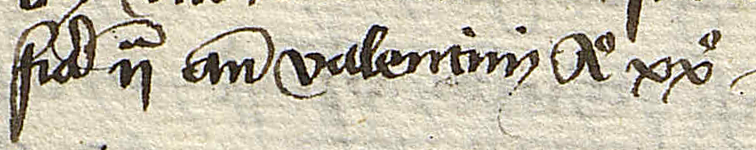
fia* ii* an* valentini A* xx*
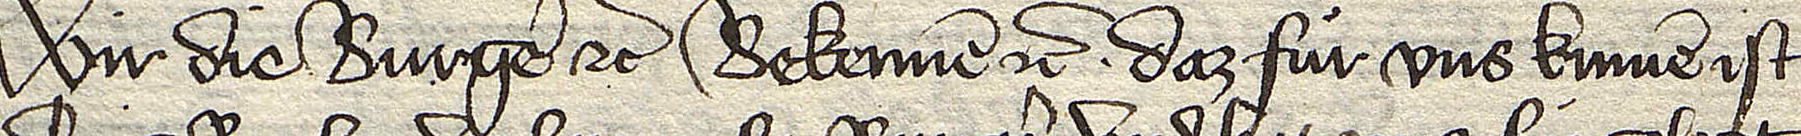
Wir die Burge* ec* Bekenne* ec* . Daʒ für vns kume* iſt
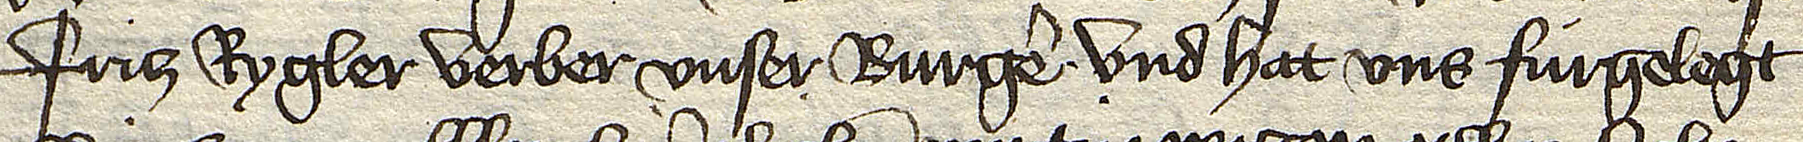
Fricʒ Rygler verber vnſer Burge* . vnd hat vns fürgelegt
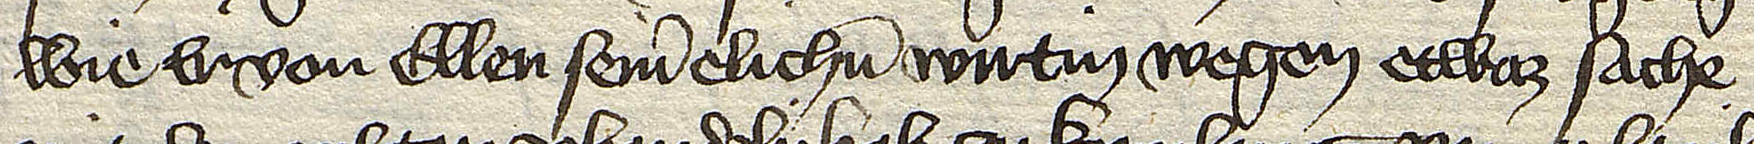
wie Er von Ellen ſein* elichn* wirtin wegen etwaʒ ſache
